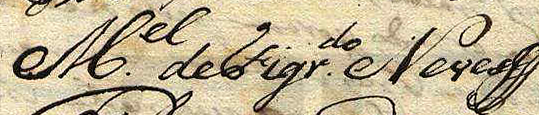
M.el de Figr.do Neves
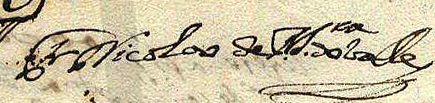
Fr Nicolao de NS.ra do valle
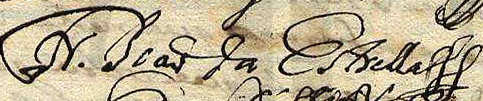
Fr. Ioaõ da Estrella
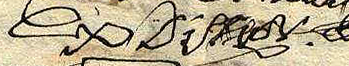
Ex Difnor.
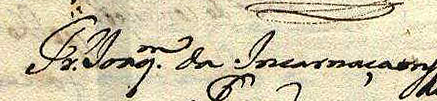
Fr. Ioaq.m da Incarnaçam
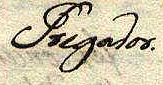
Pregador.
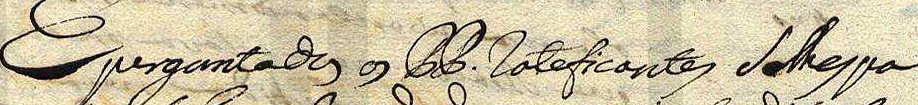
E perguntados os PP. Rateficantes se lhes pa
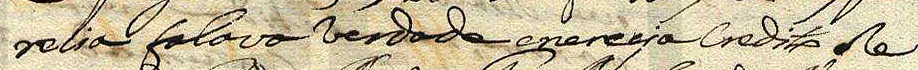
recia falava verdade e nerecja credito Re
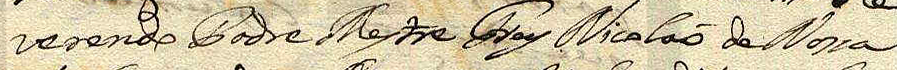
verendo Padre Mestre Frey Nicolaó de Nossa
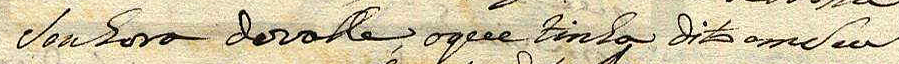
Senhora do valle, o que tinha dito em Seu
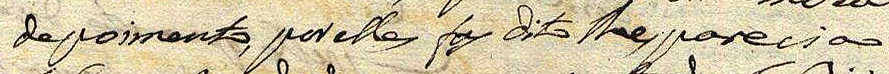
depoimento, por elles foj dito lhes parecia
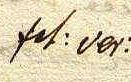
fal: ver:
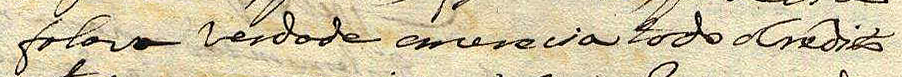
falava verdade e merecia todo o Credito
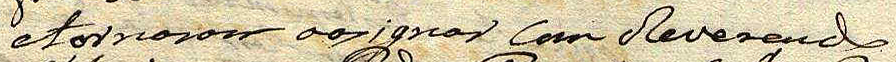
e tornaram a asignar com Reverendo
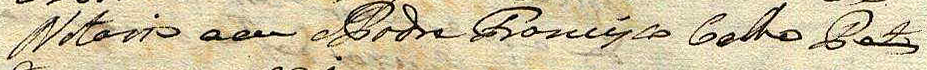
Notario e eu o Padre Francisco Coelho Pet
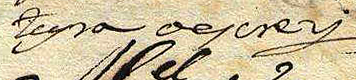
teyra o escrevj
